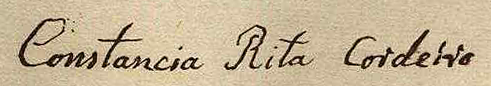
Constancia Rita Cordeiro
